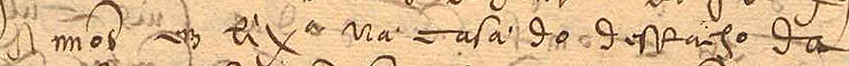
Annōs em lixa na casa do despacho da
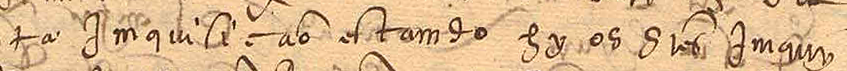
Sta. Jmquisiçaõ estamdo hy os sr̄es Jmquy
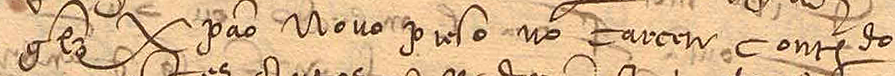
gl̄z Xpão nouo preso no carcere conthdo
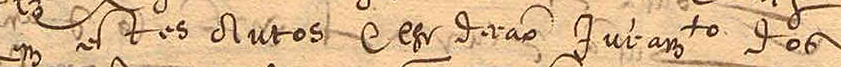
em estes Autos e lhe deraõ Juramto dos
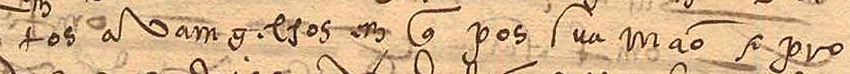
Stos avamgelhos em q̄ pos sua maõ e pro
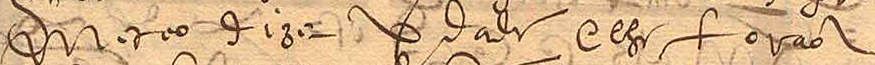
meteo dizer ꝟdade e lhe foraõ
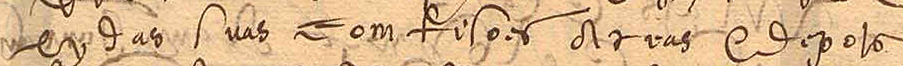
lydas suas comfisoes Atras e depois
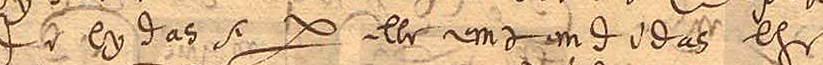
de lydas e ꝑ elle emtemdidas lhe
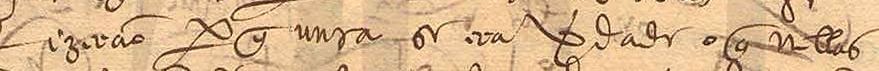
fizerão ꝑgunta se era ꝟdade o q̄ nellas
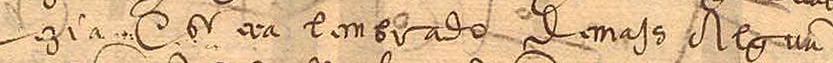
dezia e se era lembrado de majs Alguā
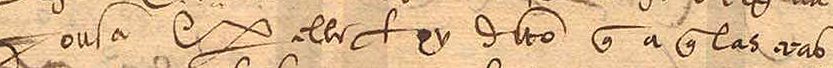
Cousa e ꝑ elle foy dīto q̄ aq̄las eraõ
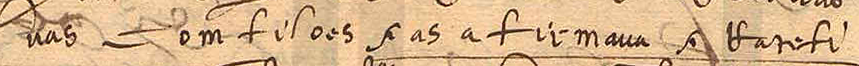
suas comfisoes e as afirmaua e Ratefi
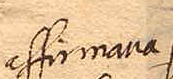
affirmaua
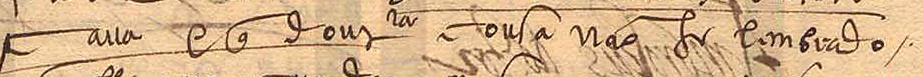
caua e q̄ doutra cousa não he lembrado /
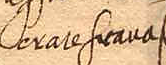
e rateficaua
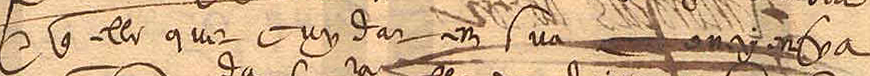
e q̄ elle quer cuydar em sua concyencya
